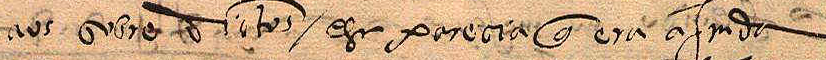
aos sobredictos / lhe parecia q̄ era aJmda
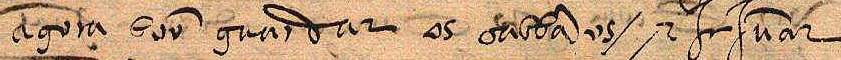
agora bōo guardar os sabbados / e JeJūar
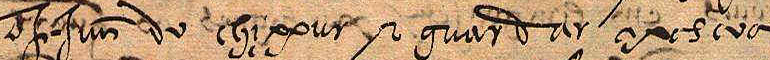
o JeJūu do chippur e guardar a pascoa
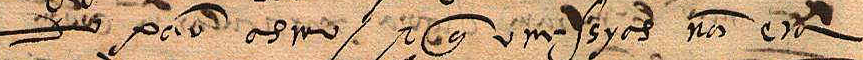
do pão asmo / e q̄ o messyas nā era
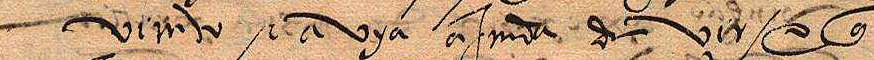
vimdo e avya aJmda de vir / e q̄
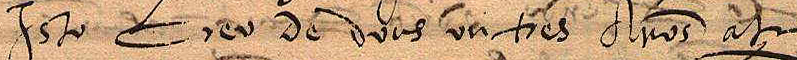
Jsto Creo de dous ou tres An̄os ate
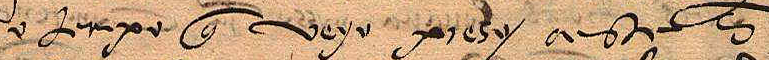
o tempo q̄ veyo preso / a este Sto
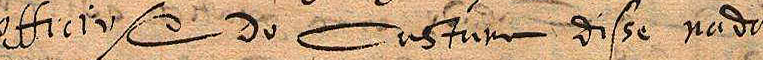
officio / e do Custume disse nada
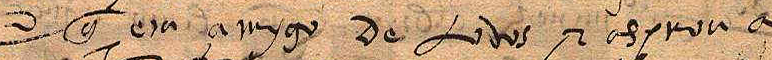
e q̄ era amygo de todos e asynou a
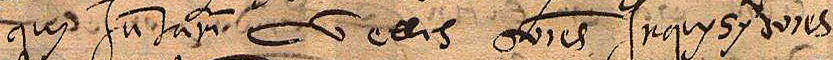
quj Jūtamte Cō elles sōres Jnquysydores
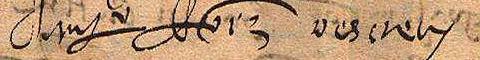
Amto Rōiz o escreuy
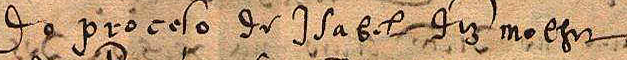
do proceso de Isabel dīz molher
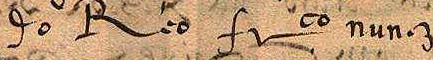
do Reo frco nunez
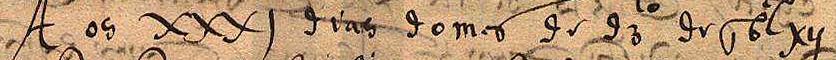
Aos XXXj dias do mes de dzro de jbclxij
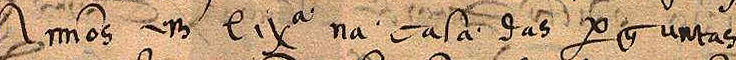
Annōs em lixa na casa das ꝑguntas
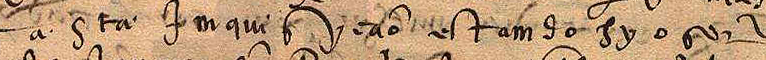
da sta. Jmquisycaõ estamdo hy o sor̄
